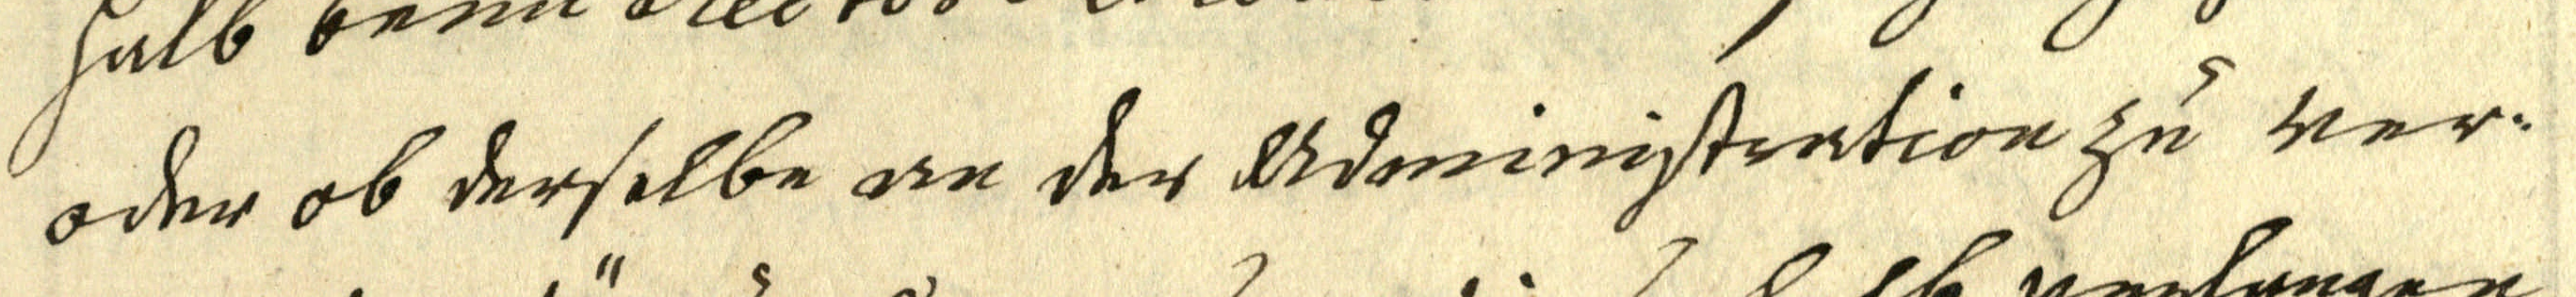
oder ob derselbe an der Administration zu ver¬
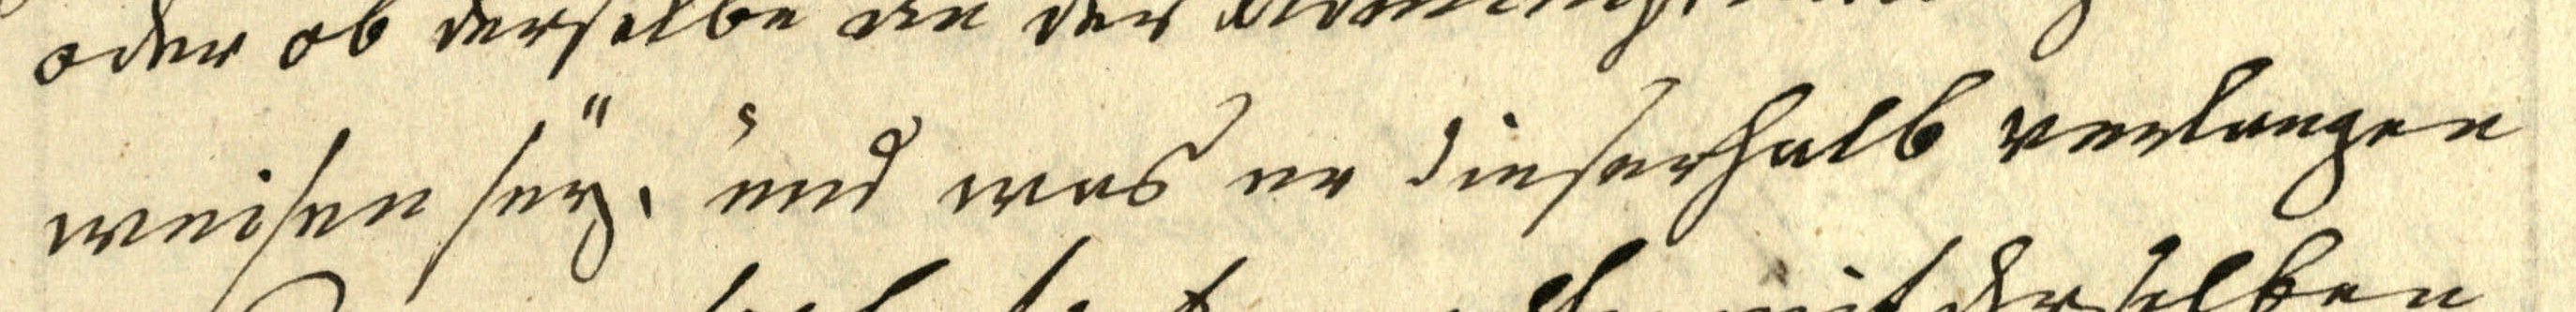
weisen seÿ, und was er dieserhalb verlangen
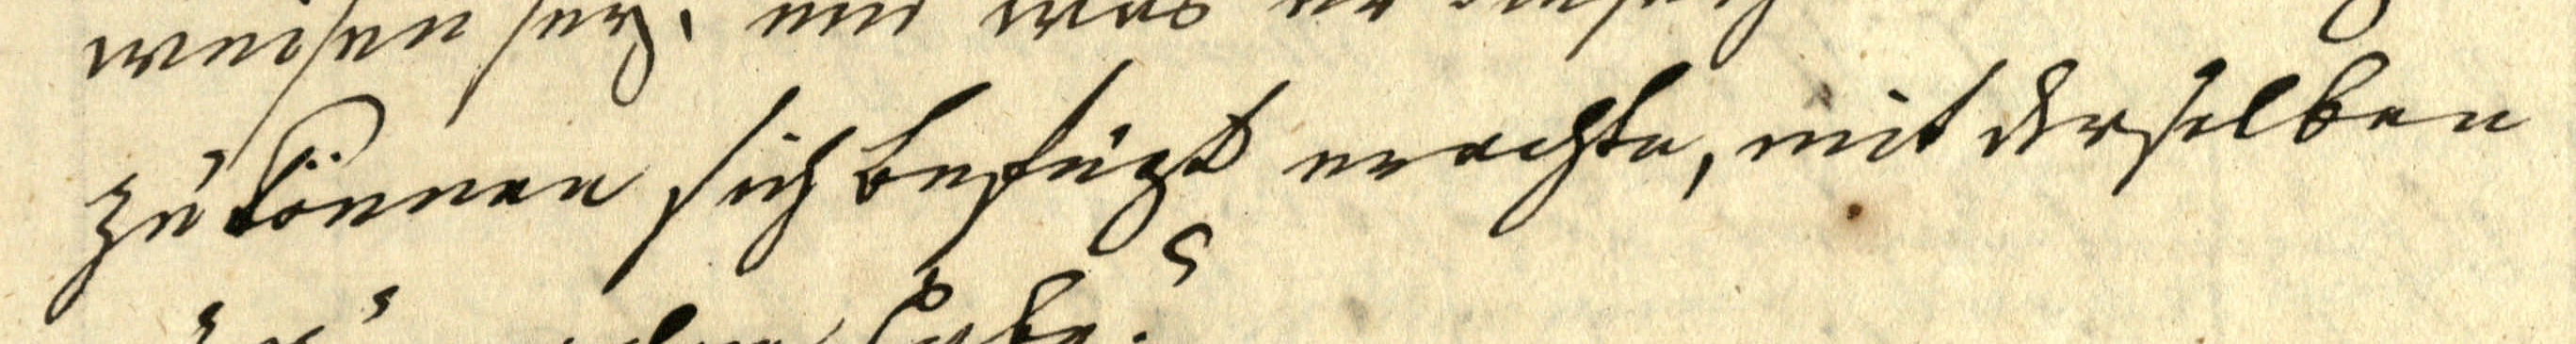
zu können sich befugt erachte, mit derselben
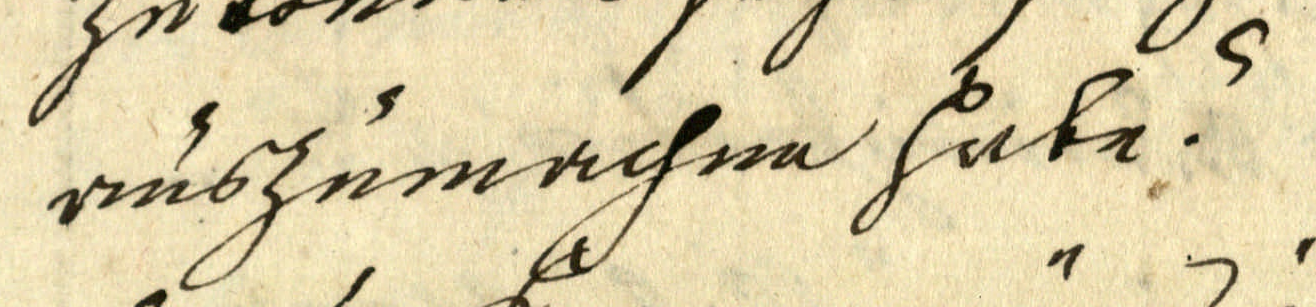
auszumachen habe?
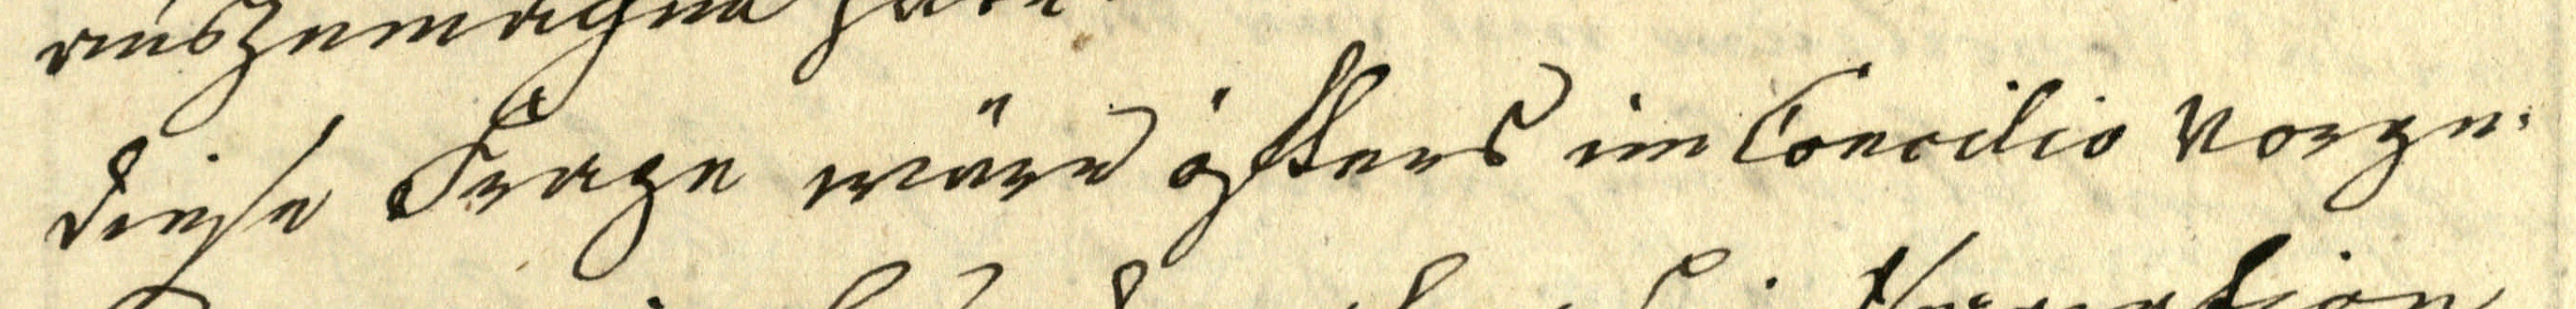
Diese Frage wäre öfters im Concilio vorge¬
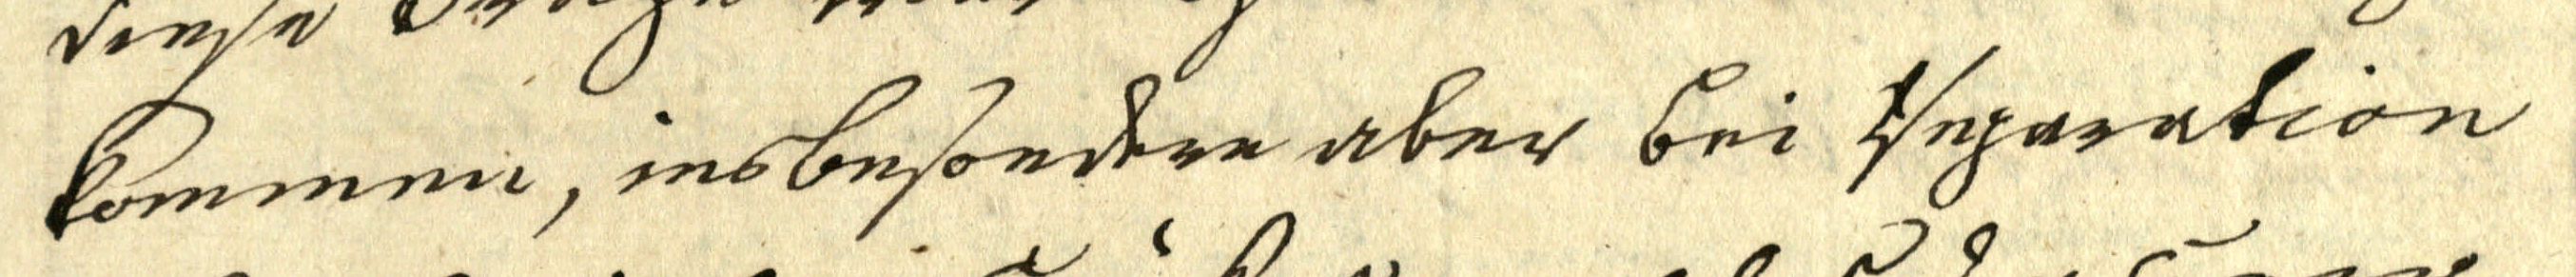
kommen, insbesondere aber bei Reparation
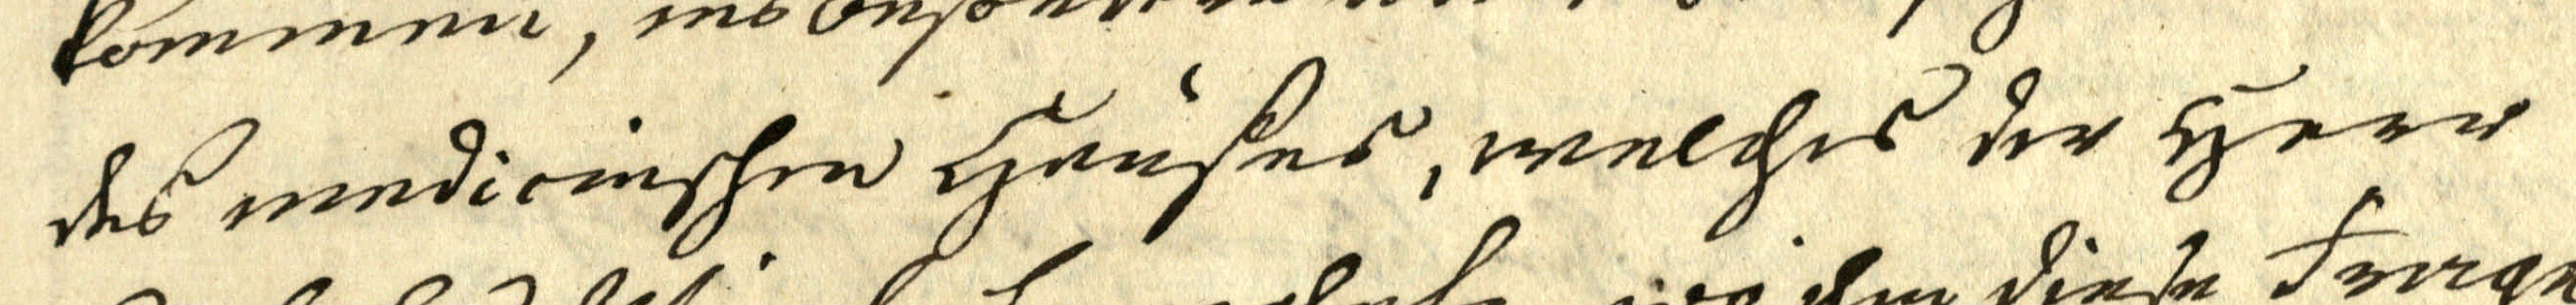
des medicinischen Haußes, welches der Herr
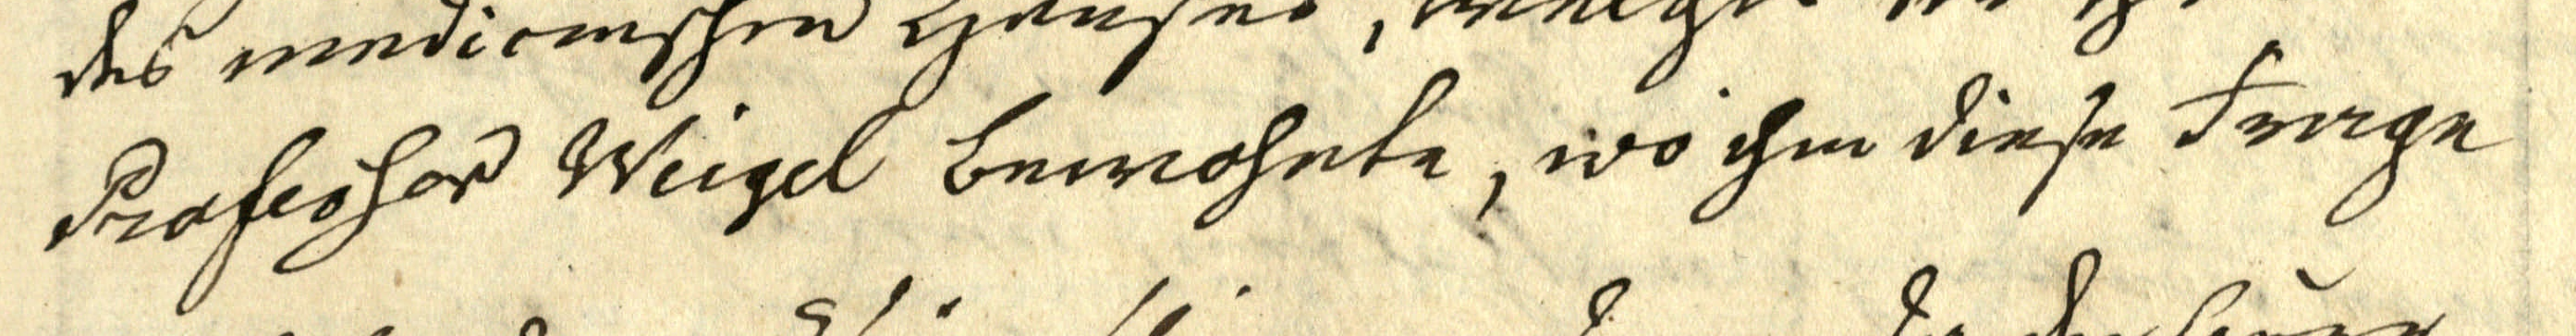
Professor Weigel bewohnte, wo ihm diese Frage
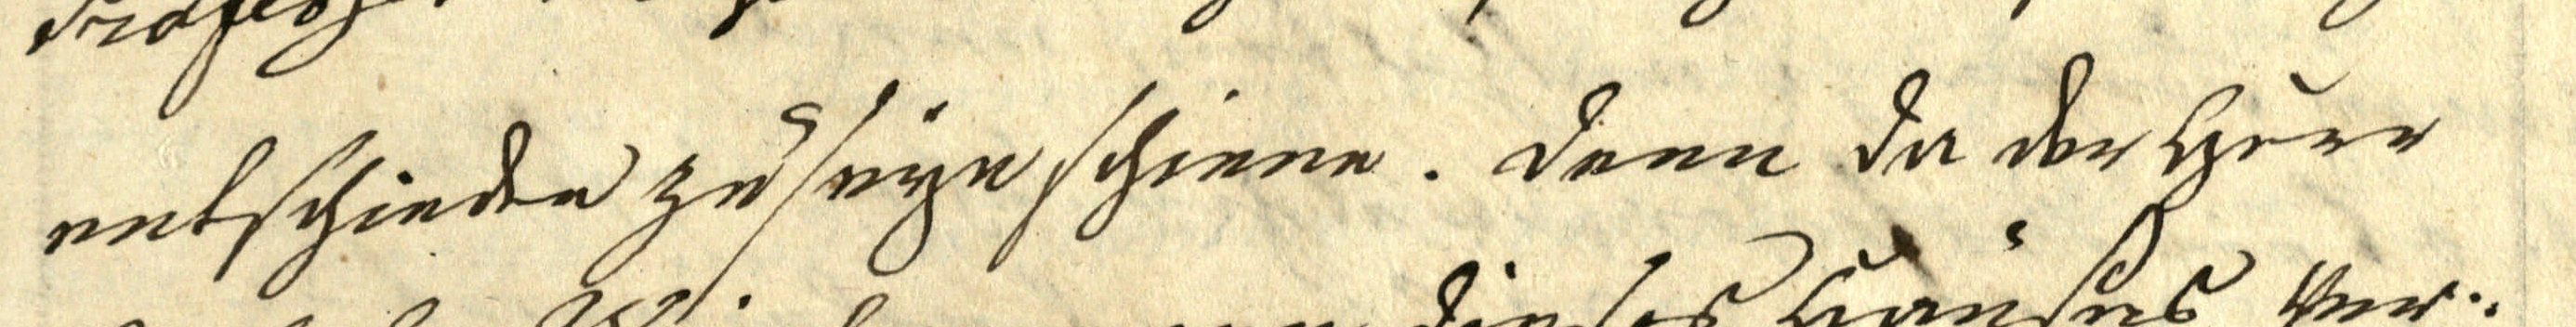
entschieden zu seÿn schiene. Denn da der Herr
